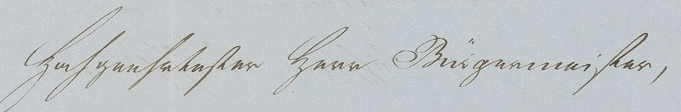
Hochgeehrtester Herr Bürgermeister,
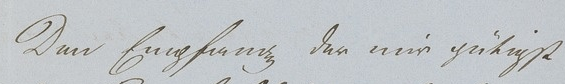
Den Empfang der mir gütigst
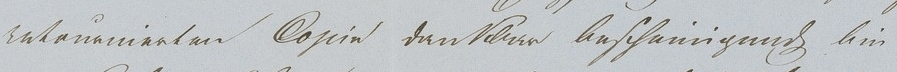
retournierten Copie dankbar bescheinigend bin
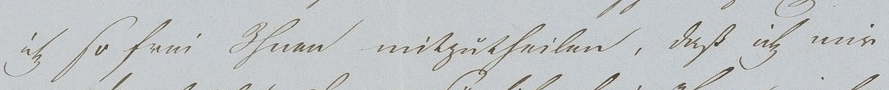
ich so frei Ihnen mitzutheilen, daß ich mir
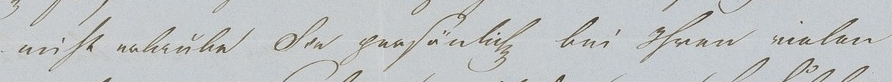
nicht erlaube Sie persönlich bei Ihren vielen
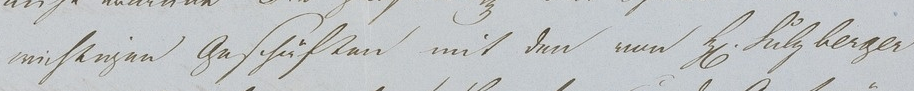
wichtigen Geschäften mit den von H. Sulzberger
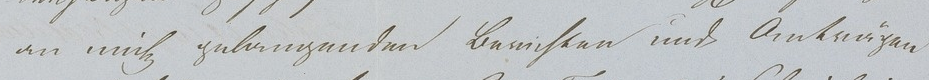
an mich gelangenden Berichten und Anträgen
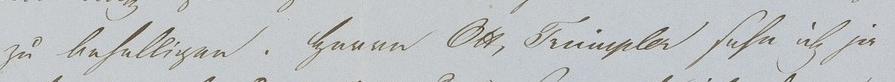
zu behelligen. Herrn Ott Trümpler sehe ich ja
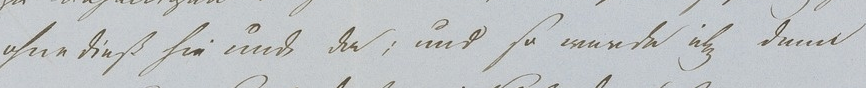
ohne dieß hie und da; und so werde ich denn
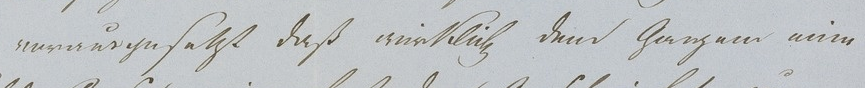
vorausgesetzt daß wirklich dem Ganzem eine
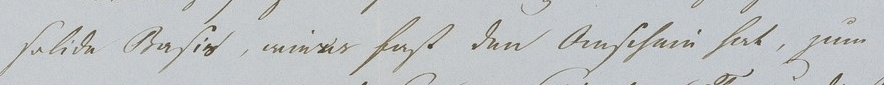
solide Basis, wie es fast den Anschein hat, zum
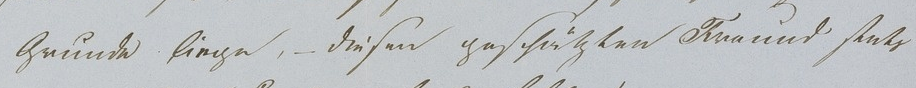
Grunde liege, – diesen geschätzten Freund stets
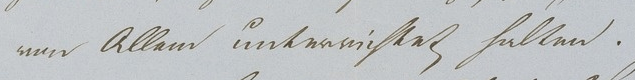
von Allem unterrichtet halten.
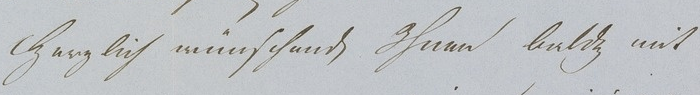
Herzlich wünschend Ihnen bald mit
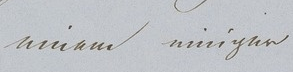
einem einiger
